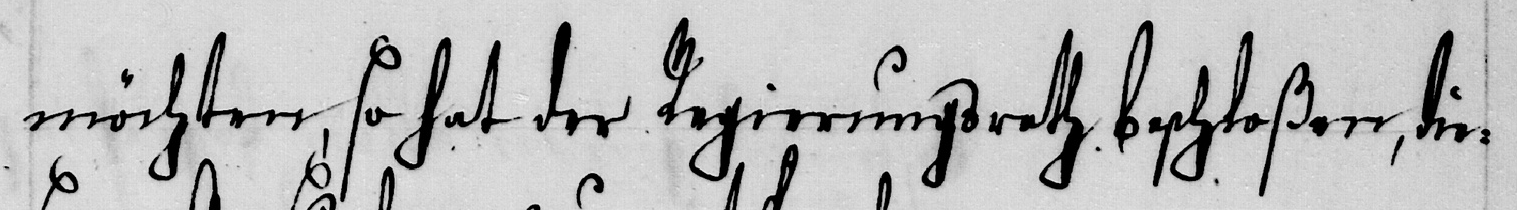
möchten, so hat der Regierungsrath beschloßen, di¬
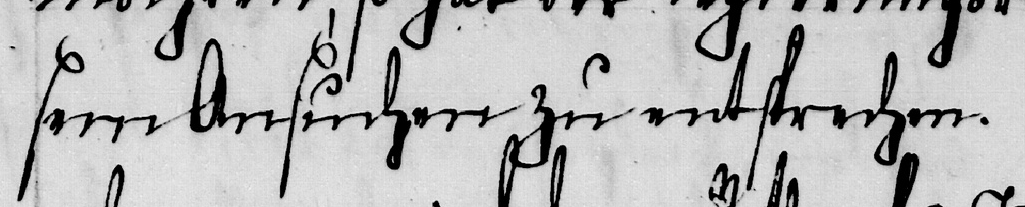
esem Ansuchen zu entsprechen.
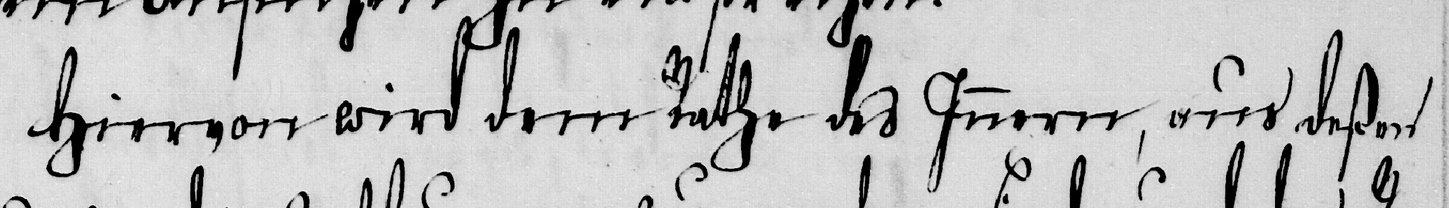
Hiervon wird dem Rathe des Innern, aus deßen
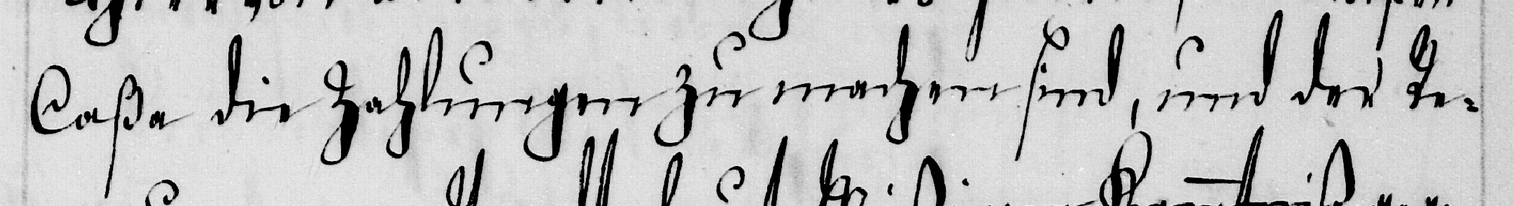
Caßa die Zahlungen zu machen sind, und der Re¬
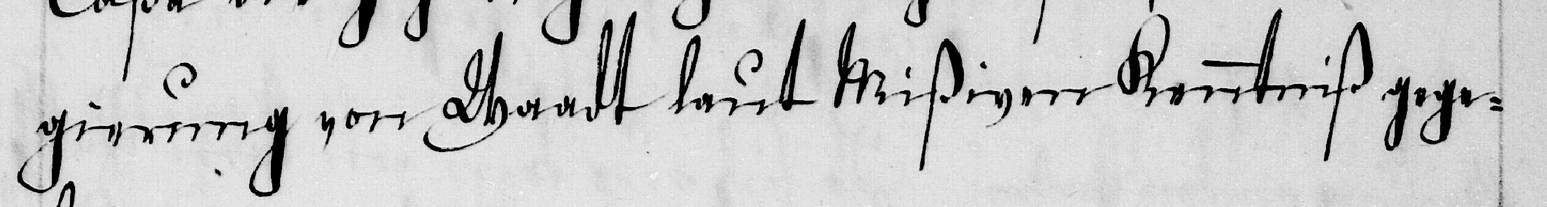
gierung von Waadt laut Mißiven Kenntniß gege¬
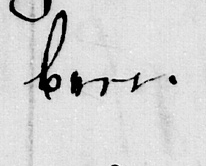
ben.
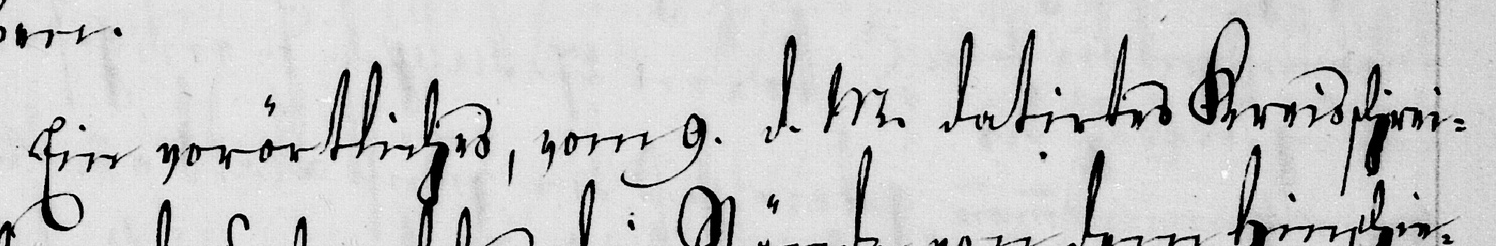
Ein vorörtliches, vom 9. d. M. datirtes Kreisschrei¬
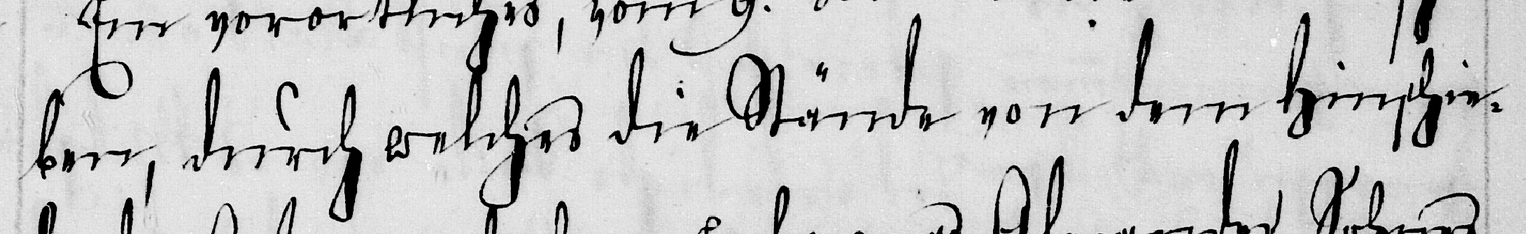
ben, durch welches die Stände von dem Hinschie¬
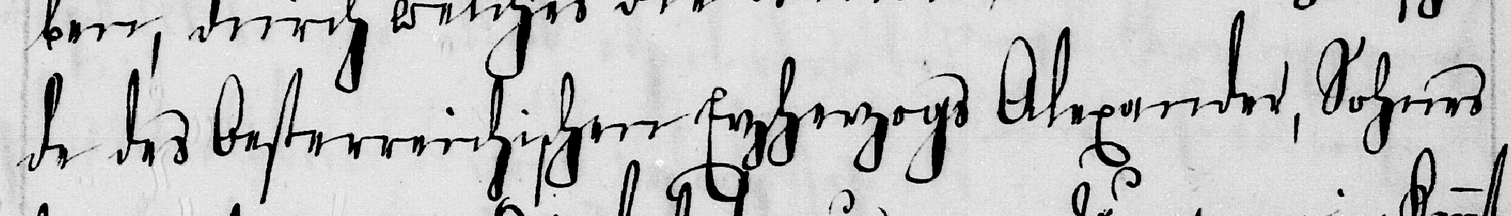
de des Oesterreichischen Erzherzogs Alexander, Sohnes
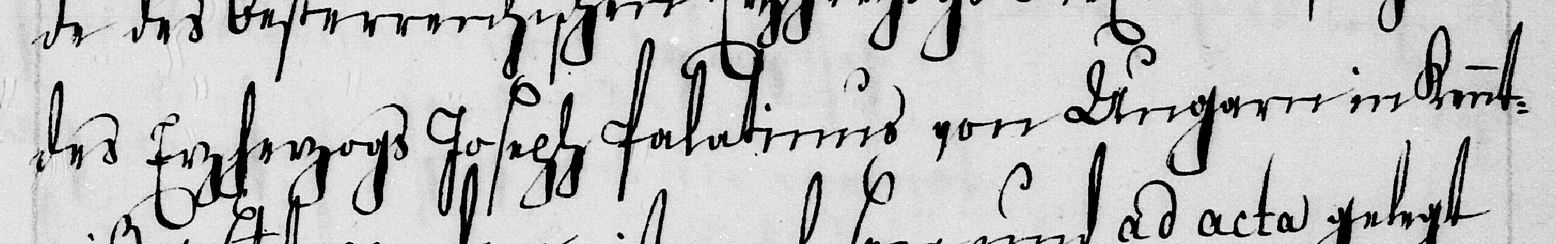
des Erzherzogs Joseph Palatinus von Ungarn in Kenn¬
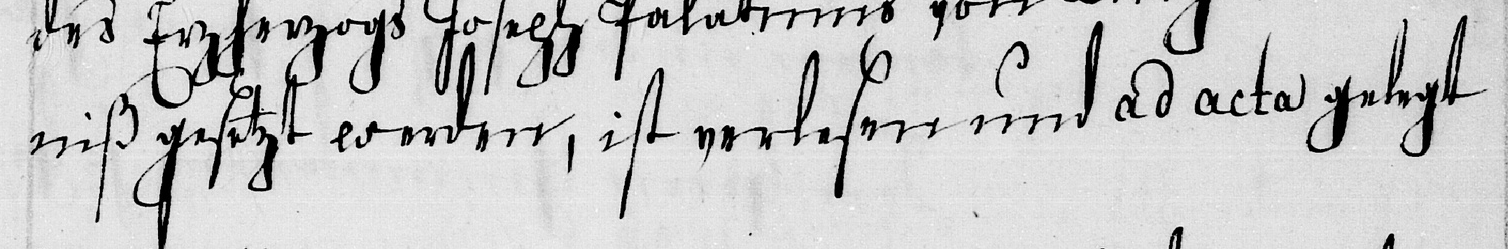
tniß gesetzt worden, ist verlesen und ad acta gelegt
